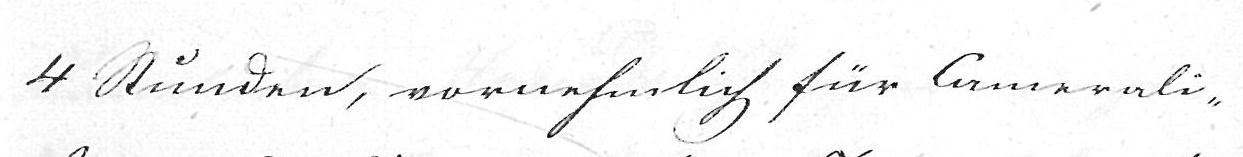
4 Stunden, vornehmlich für Camerali-
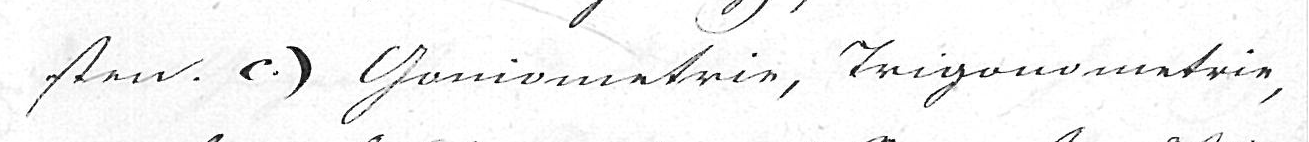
sten. c) Goniometrie, Trigonometrie,
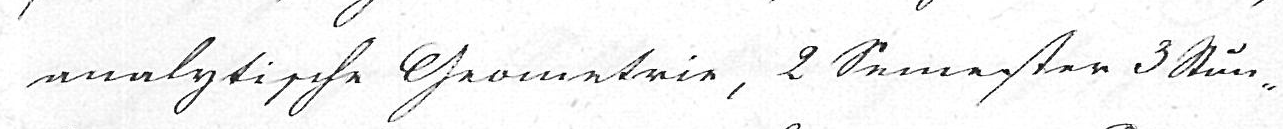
analytische Geometrie, 2 Semester 3 Stun-
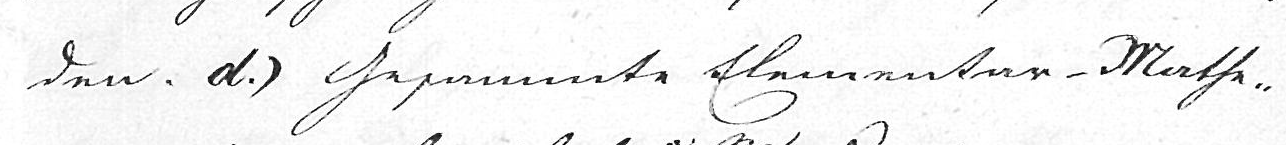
den. d) Gesammte Elementar-Mathe-
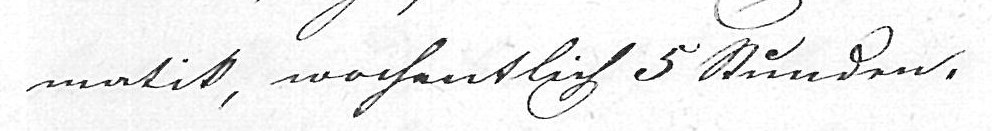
matik, wochentlich 5 Stunden.
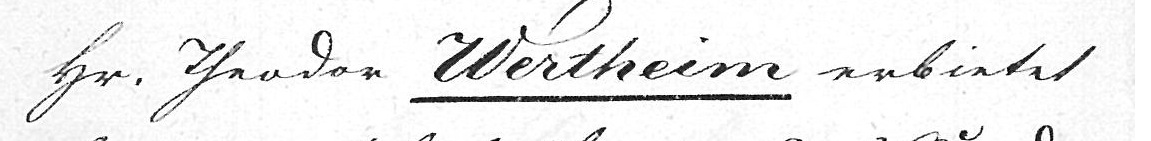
Hr. Theodor Wertheim erbietet
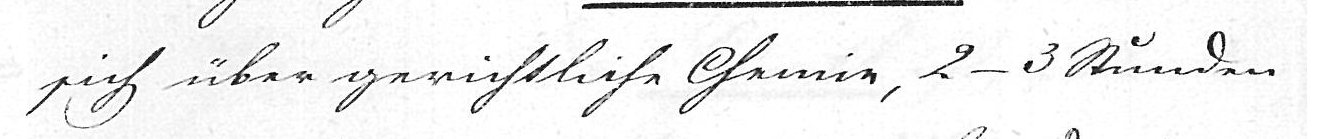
sich über gerichtliche Chemie, 2-3 Stunden
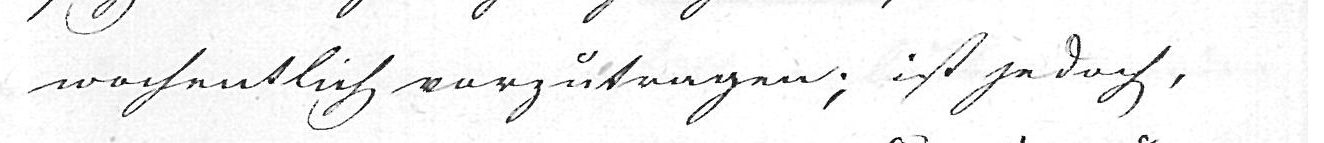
wochentlich vorzutragen; ist jedoch,
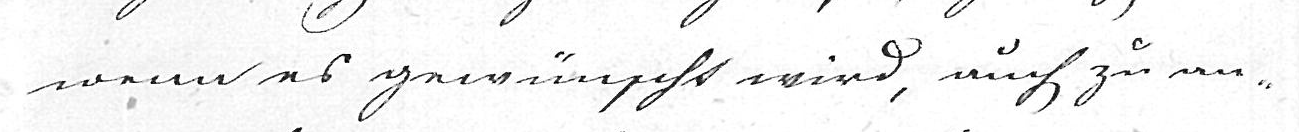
wenn es gewünscht wird, auch zu an-
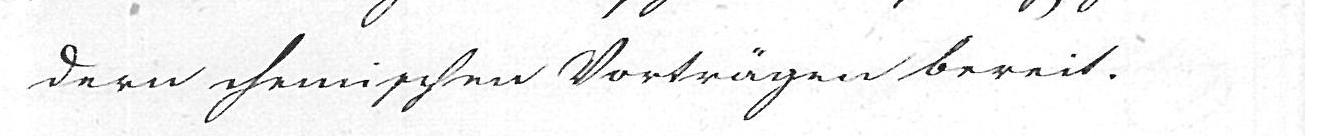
dern chemischen Vorträgen bereit.
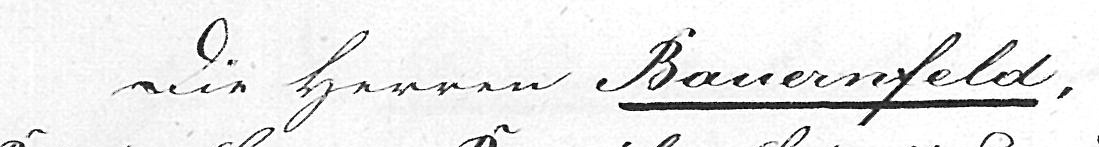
Die Herren Bauernfeld,
